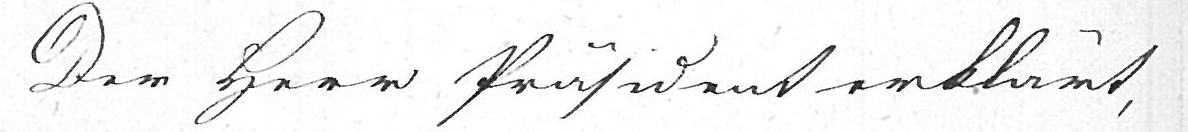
Der Herr Präsident erklärt,
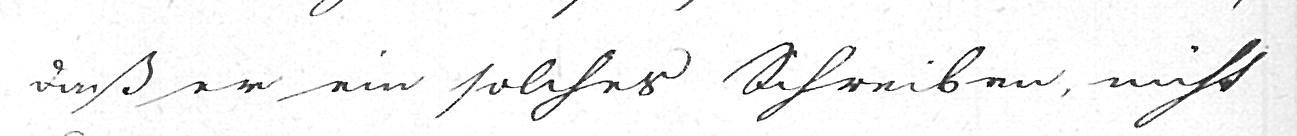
daß er ein solches Schreiben nicht
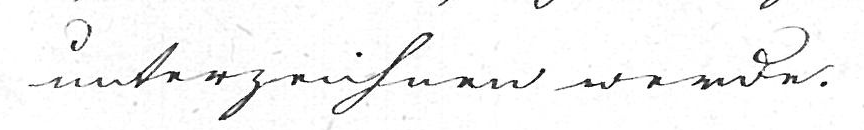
unterzeichnen werde.
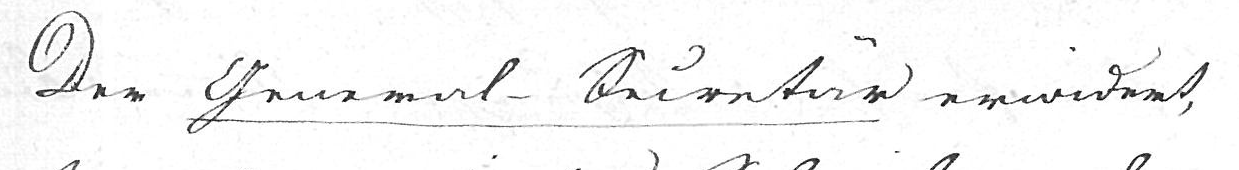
Der General-Secretär erwidert,
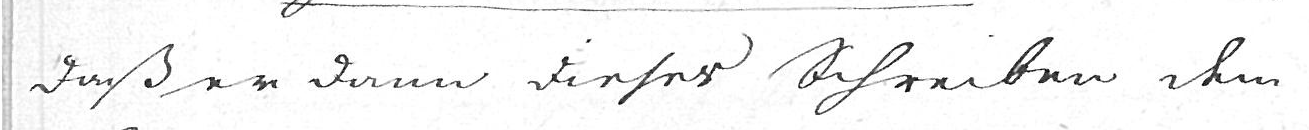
daß er dann dieses Schreiben dem
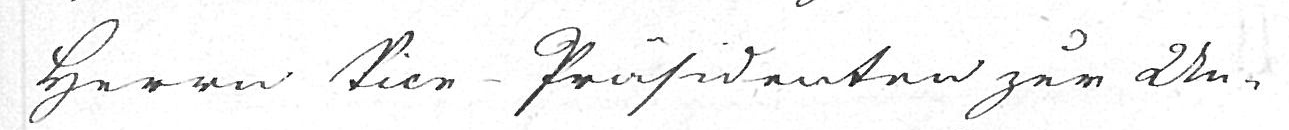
Herrn Vice-Präsidenten zur Un-
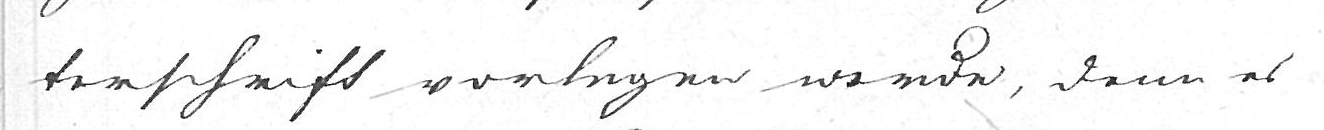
terschrift vorlegen werde, denn es
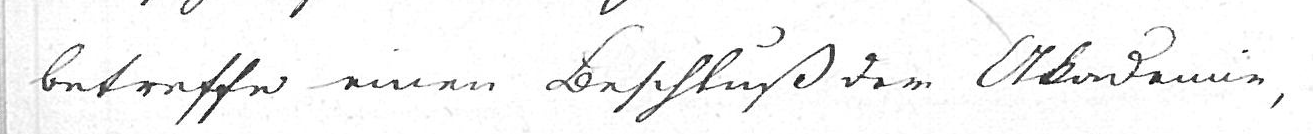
betreffe einen Beschluß der Akademie,
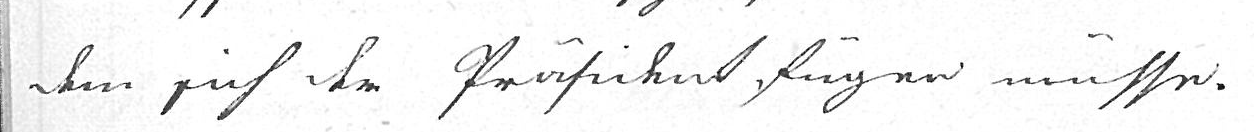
dem sich der Präsident fügen müsse.
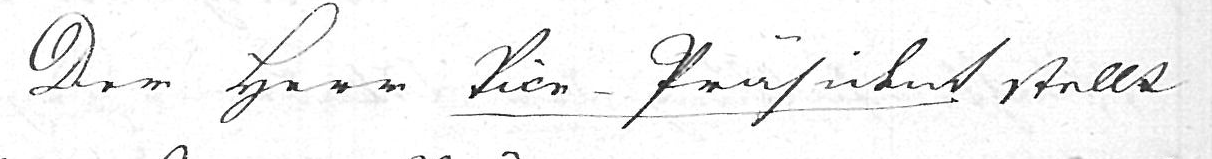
Der Herr Vice-Präsident stellt
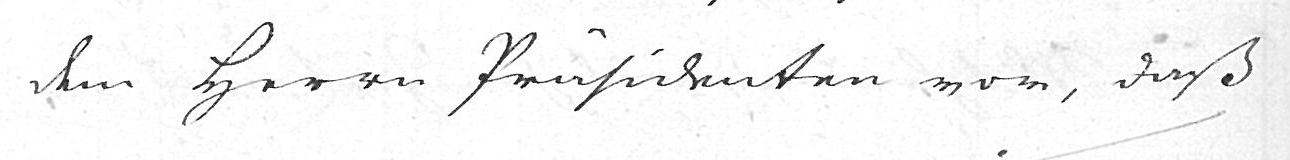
dem Herrn Präsidenten vor, daß
